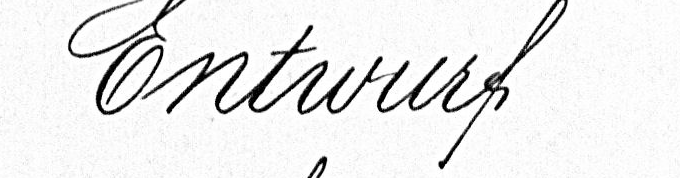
Entwurf
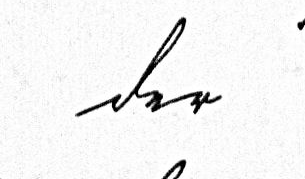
der
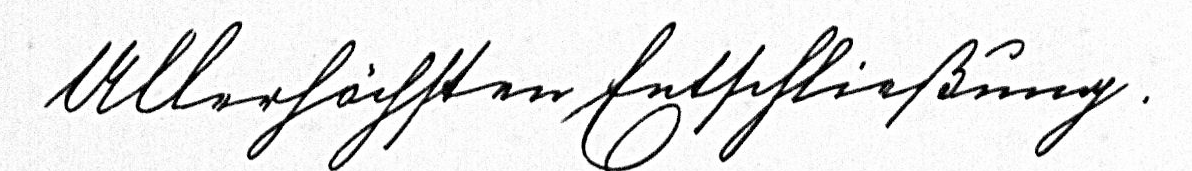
Allerhöchstens Entschließung.
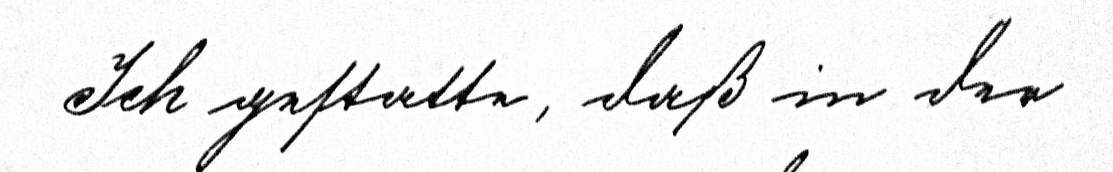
Ich gestatte, daß in der
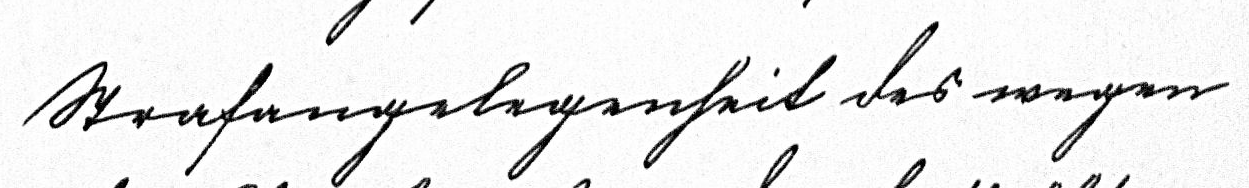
Strafangelegenheit des wegen
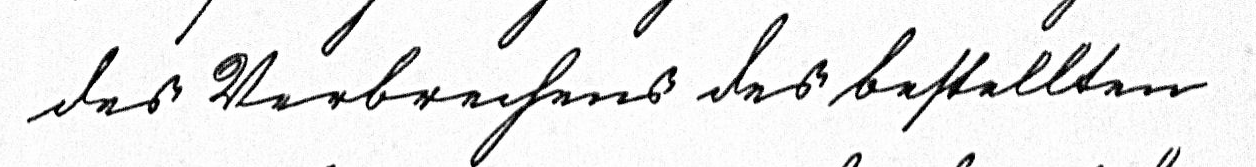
des Verbrechens des bestellten
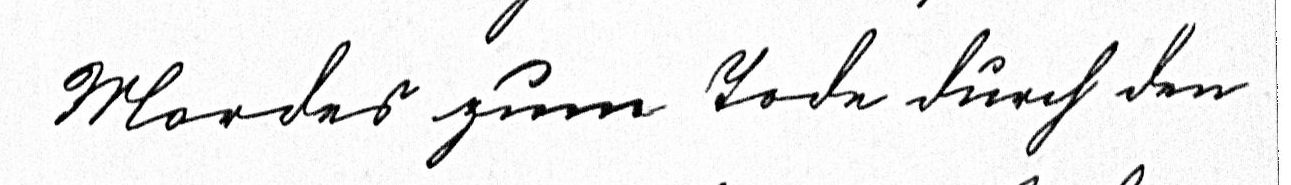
Mordes zum Tode durch den
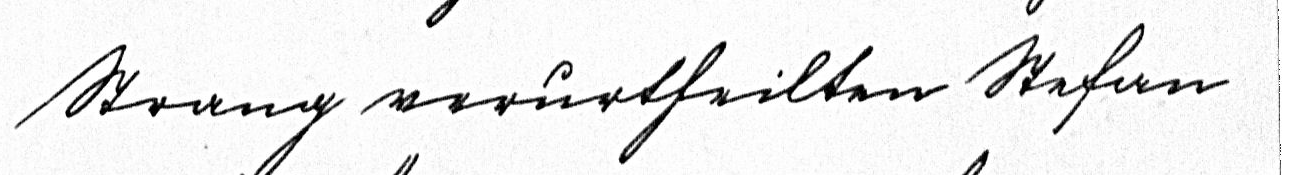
Strang verurtheilten Stefan
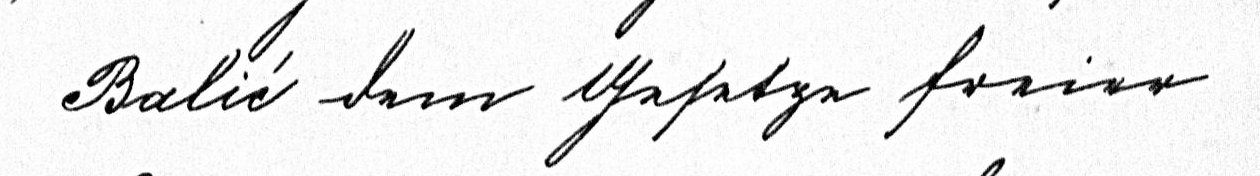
Balić dem Gesetze freier
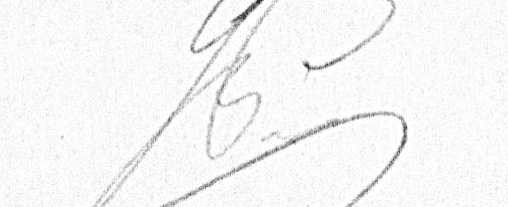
xx
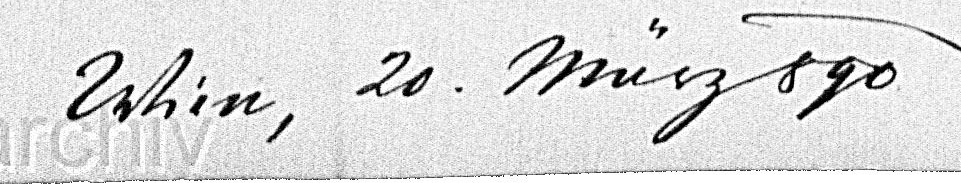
Wien, 20. März 890
